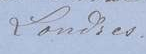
Londres.
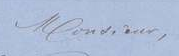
Monsieur,
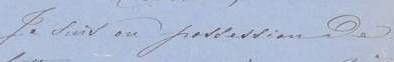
Je suis en possession de
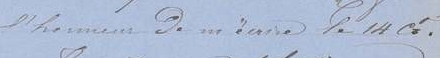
l'honneur de m'écrire le 14 Ct.
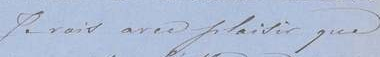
Je vois avec plaisir que
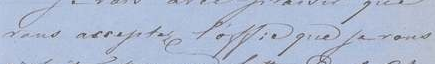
vous acceptez l'offre que je vous
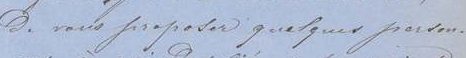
de vous proposer quelques person-
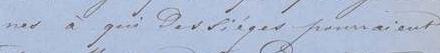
nes à qui des sièges pourraient
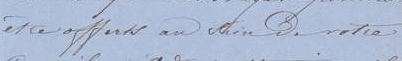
être offerts au sein de votre
